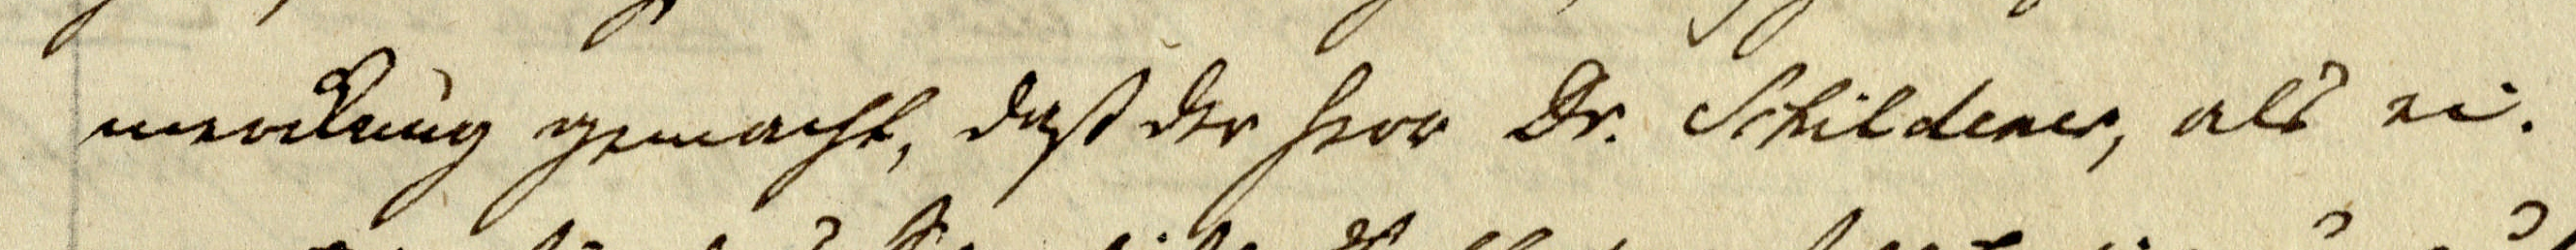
merckung gemacht, daß der Herr Dr. Schildener, als ei¬
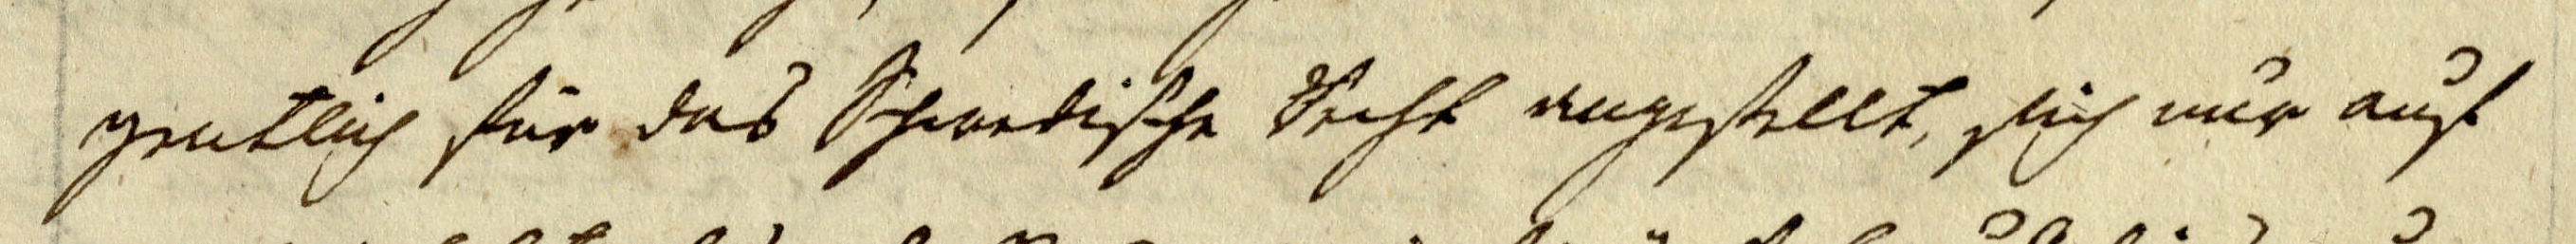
gentlich für das Schwedische Recht angestellt, sich nur auf
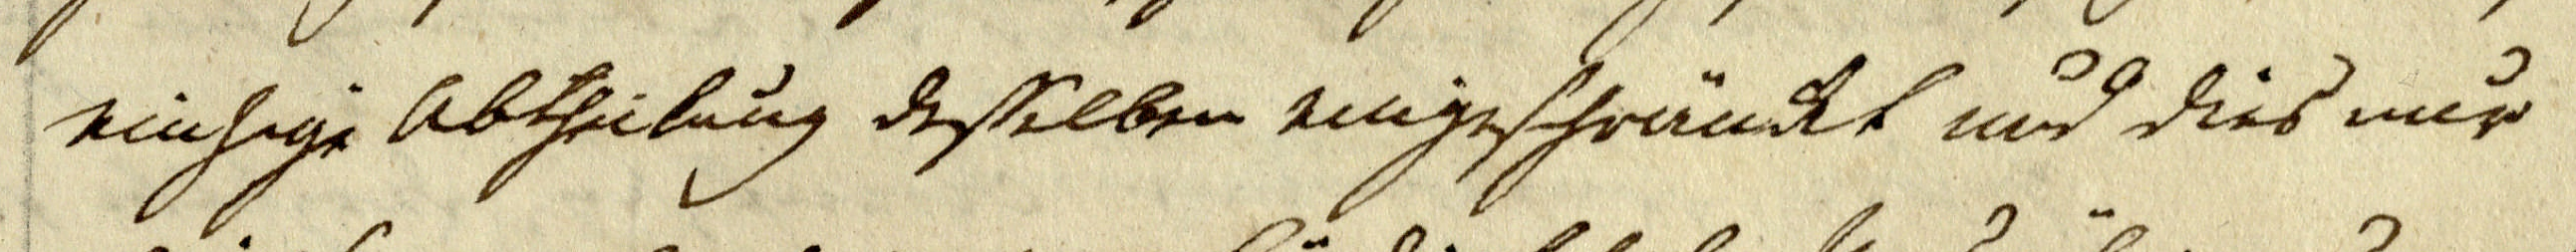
einzige Abtheilung desselben eingeschränckt und dies nur
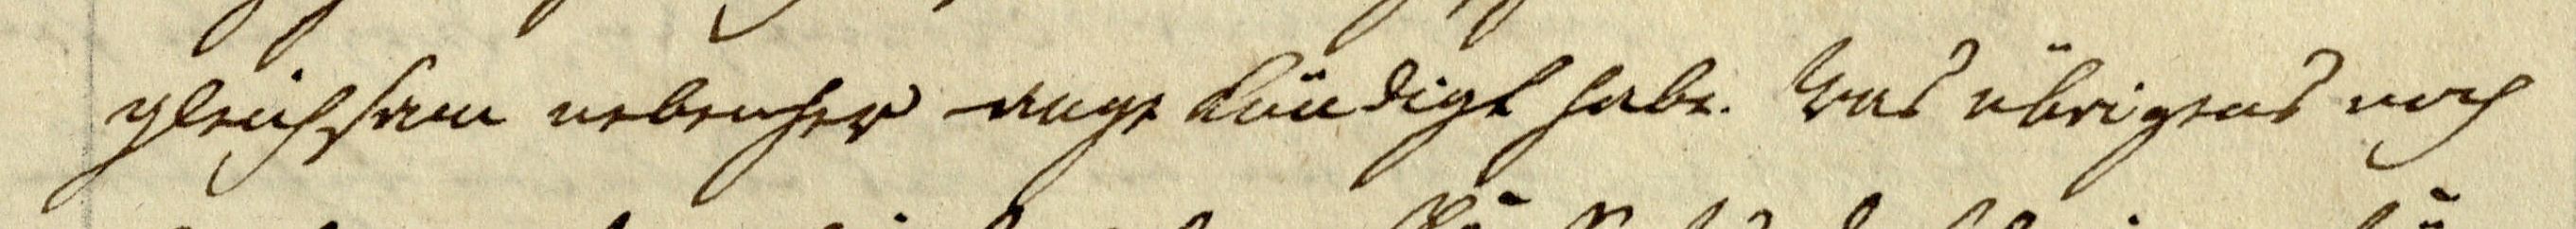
gleichsam nebenher angekündiget habe. Was übrigens noch
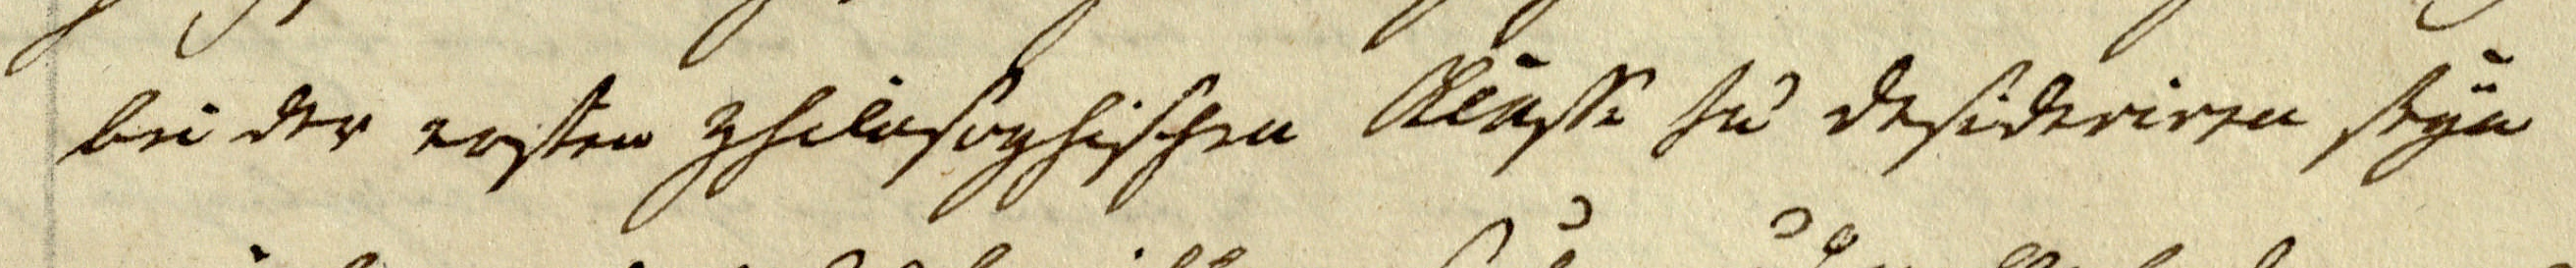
bei der ersten philosophischen Klasse zu desideriren seÿn
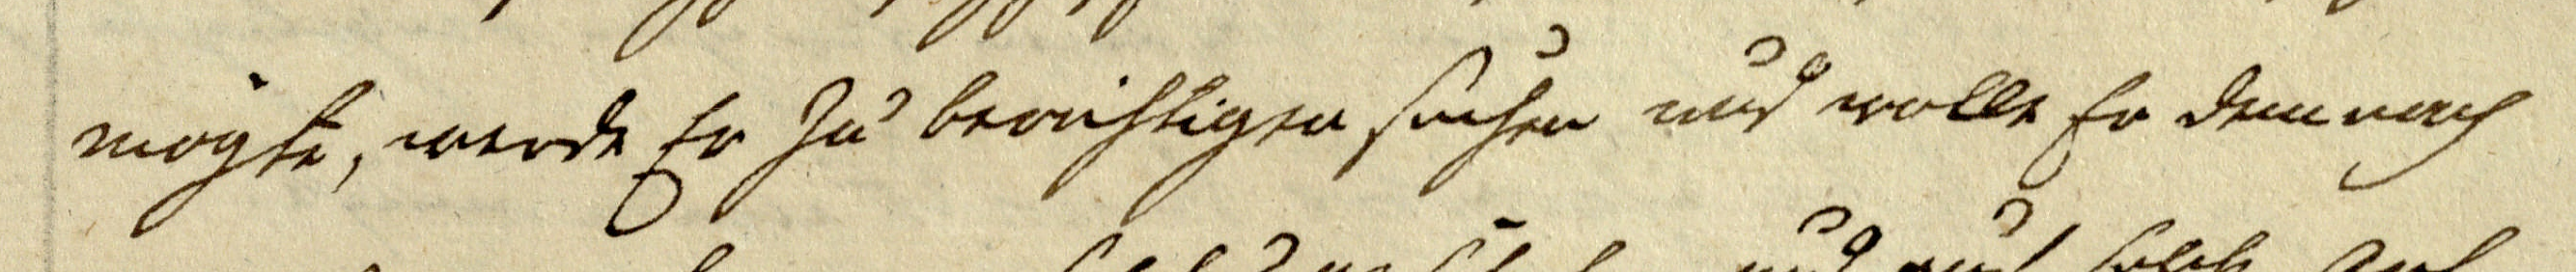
mögte, werde Er zu berichtigen suchen und wolle Er demnach
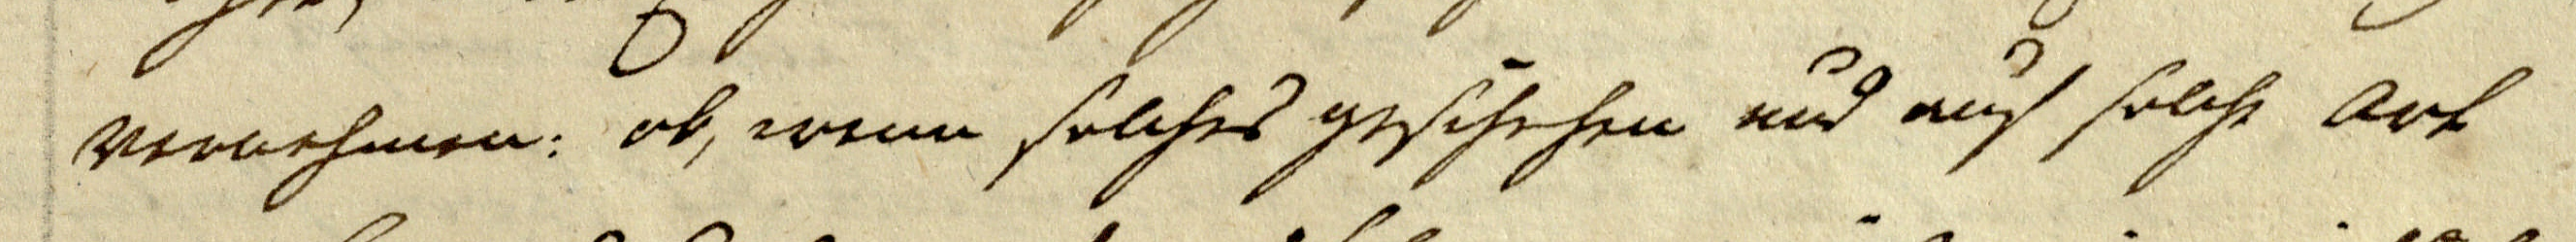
vernehmen: ob, wenn solches geschehen und auf solche Art
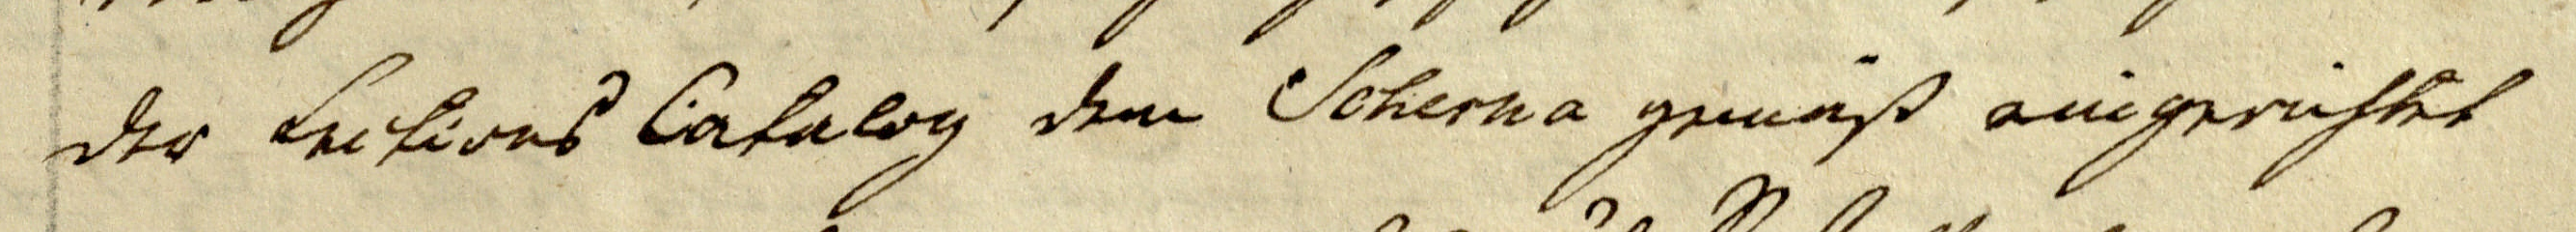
der Lections Catalog dem Schema gemäß eingerichtet
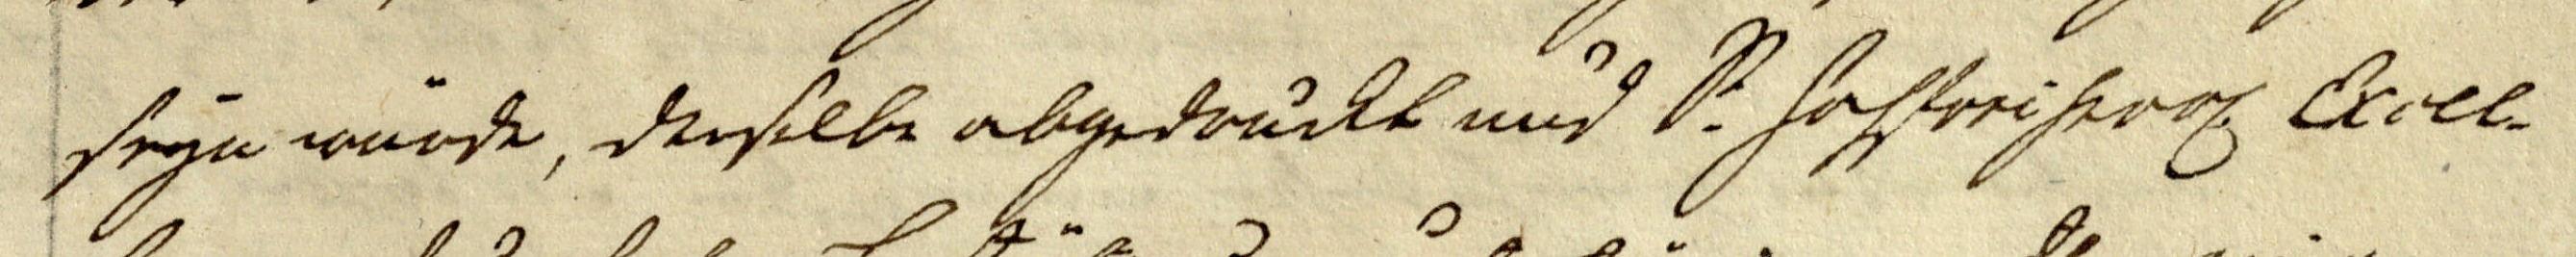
seÿn würde, derselbe abgedruckt und Sr. Hochfreiherrl. Excel¬
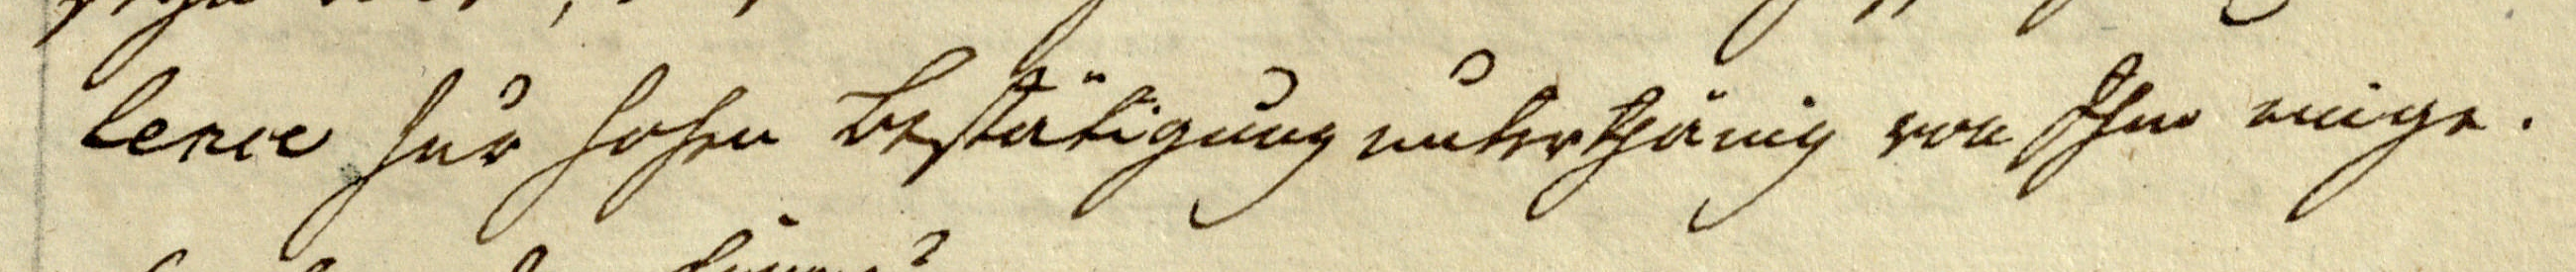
lence zur hohen Bestätigung unterthänig von Ihm einige¬
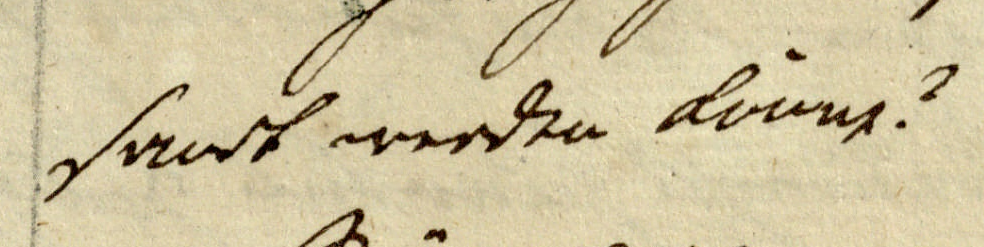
sandt werden könne?
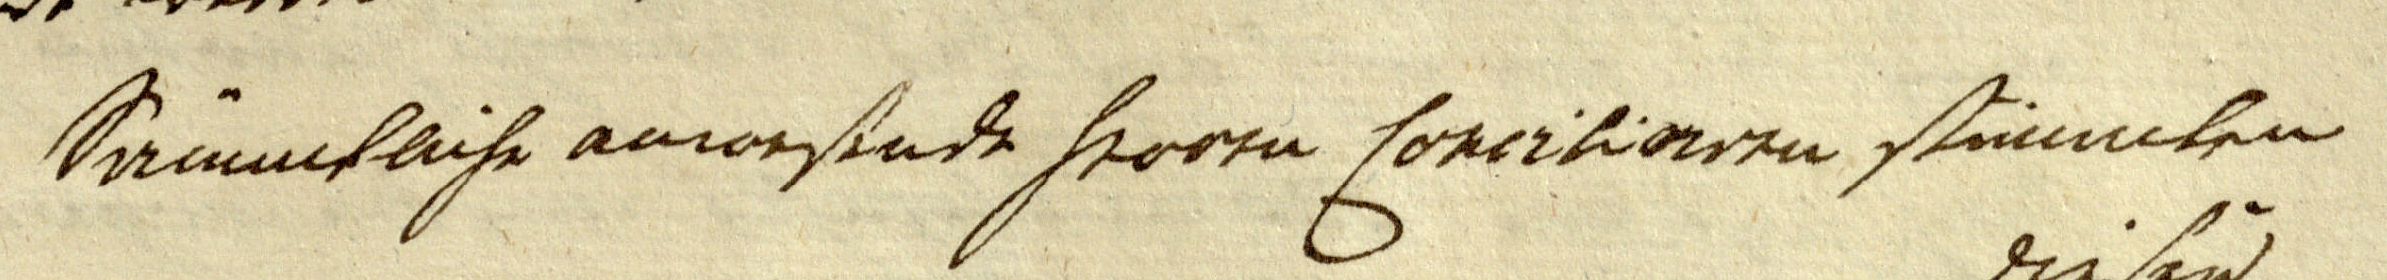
Sämmtliche anwesende Herren Conciliaren stimmten
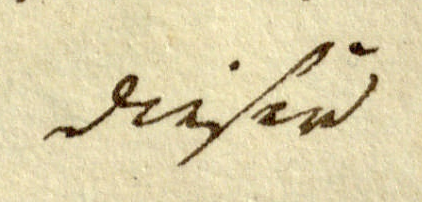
dieser
